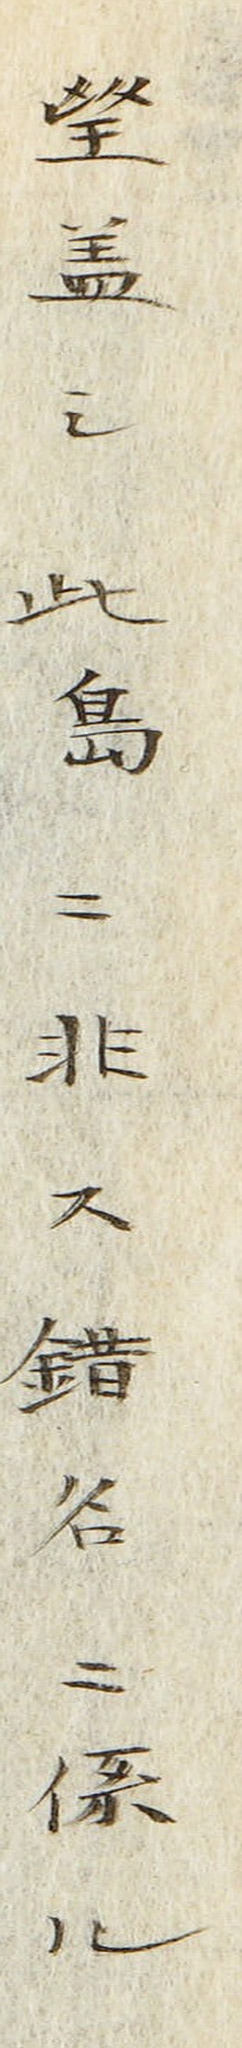望盖シ此島ニ非ス錯名ニ係ル
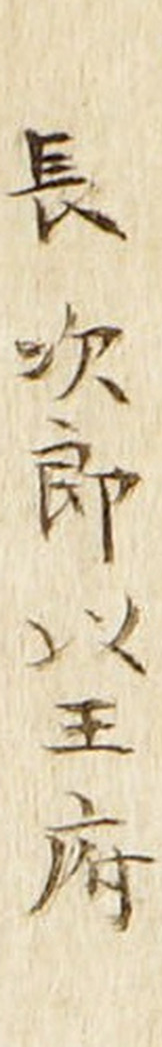長次郎以王府
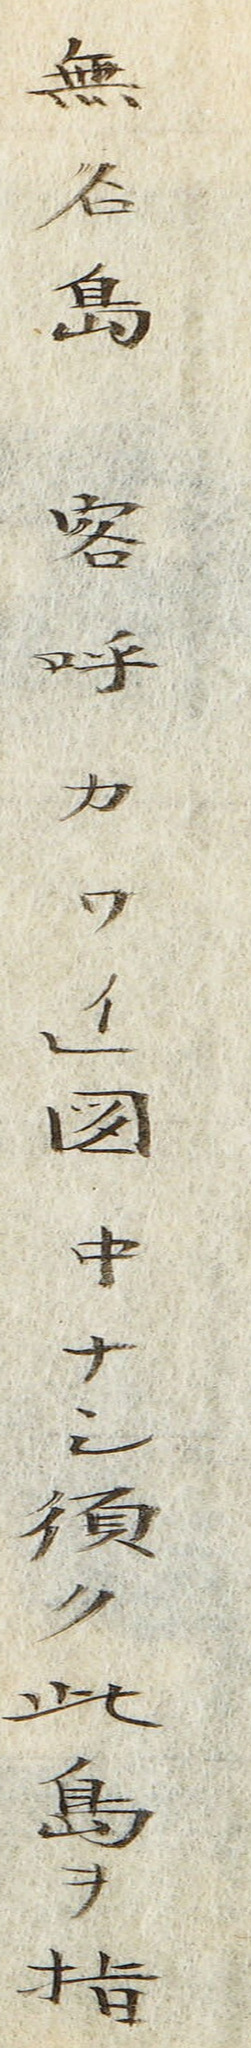無名島客呼カワイ」図中ナシ須ク此島ヲ指
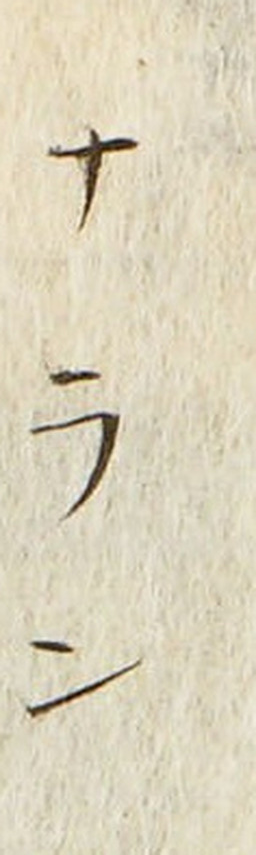ナラン
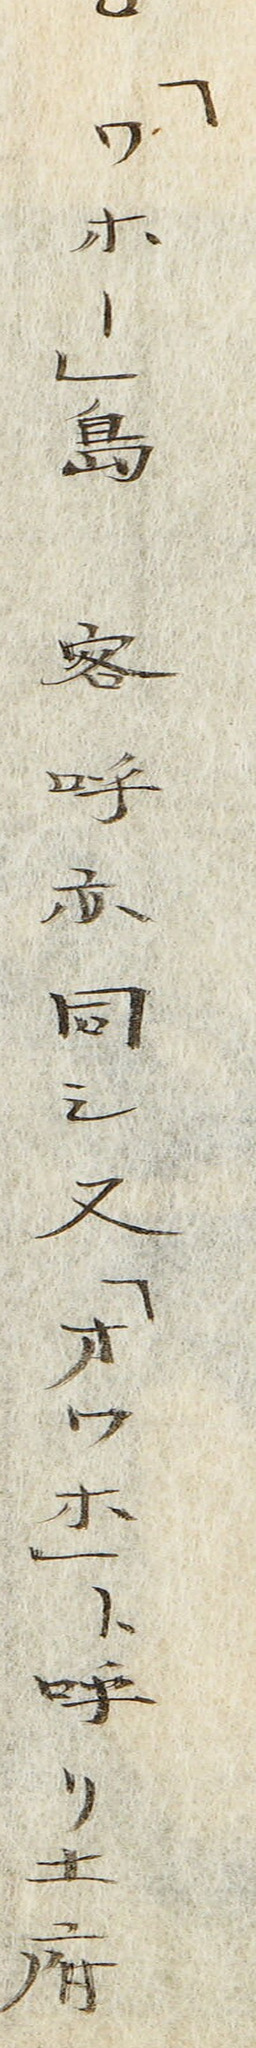◦「ワホー」島客呼亦同シ又「オワホ」ト呼リ土府
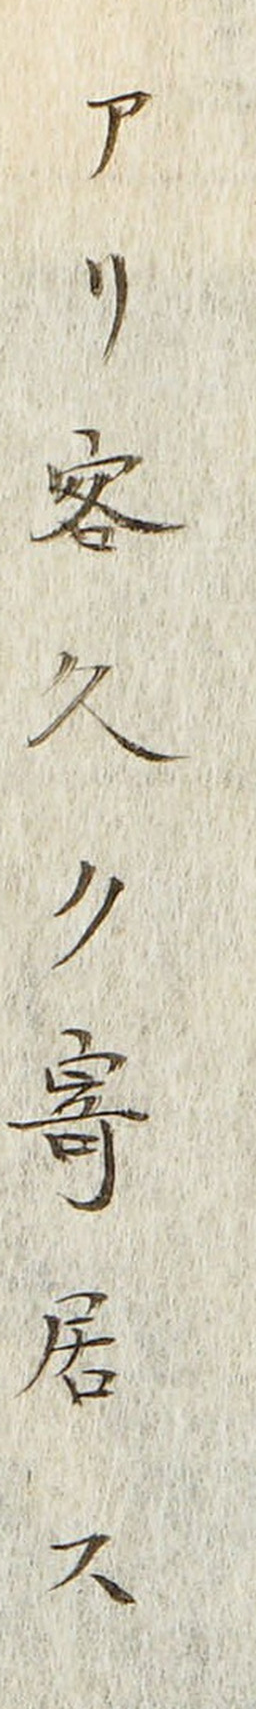アリ客久ク寄居ス
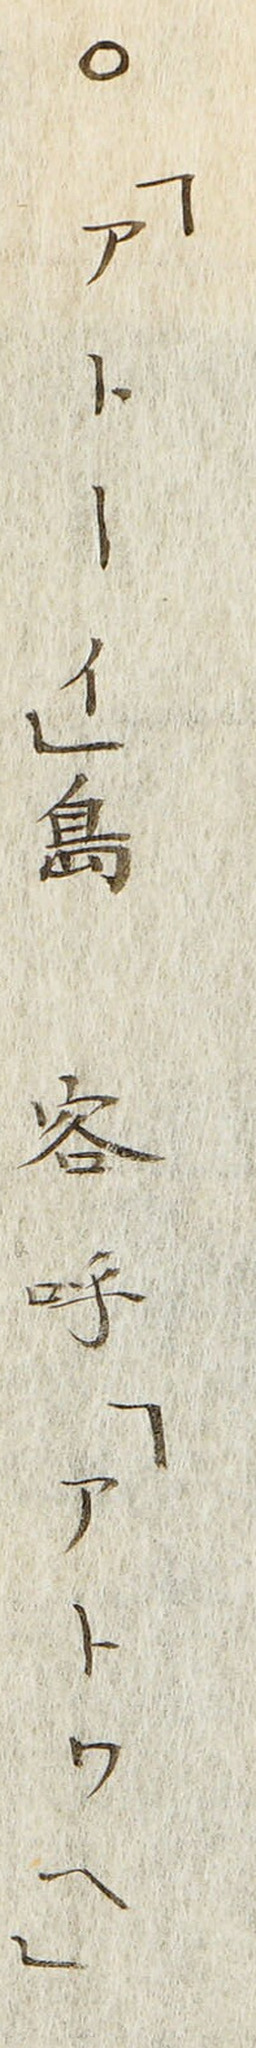◦「アトーイ」島客呼「アトワヘ」
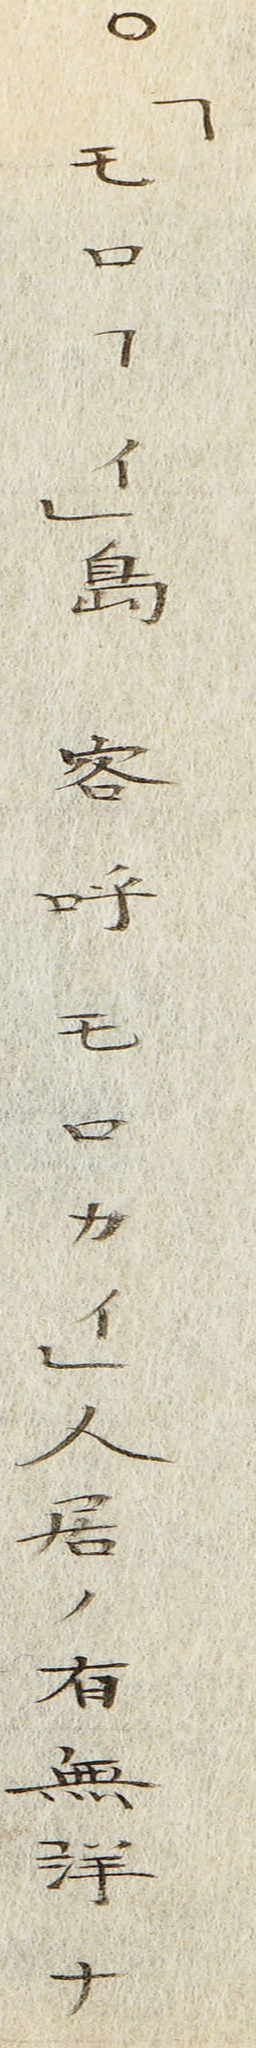◦「モローイ」島客呼モロカイ」人居ノ有無詳ナ
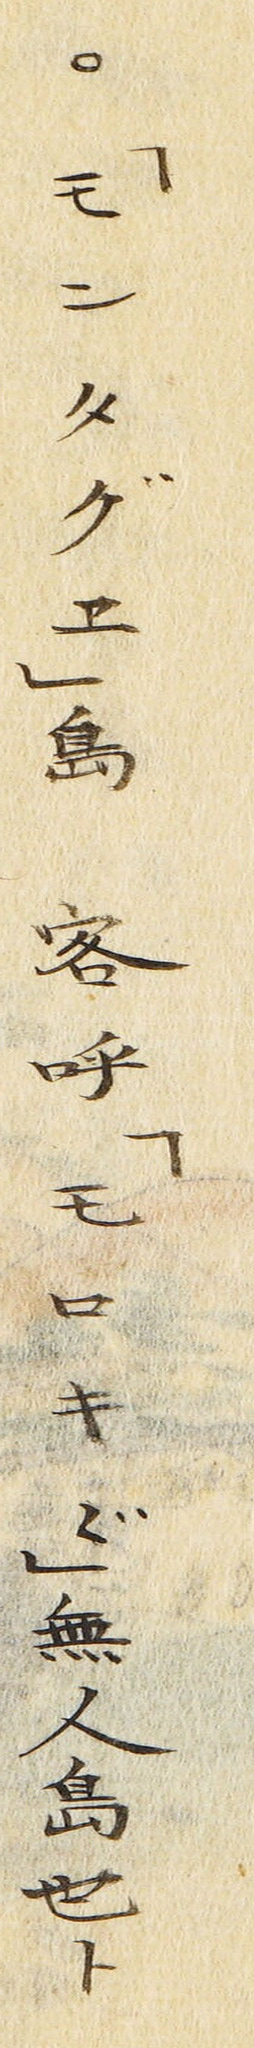◦「モンタグヱ」島客呼「モロキヾ」無人島也ト
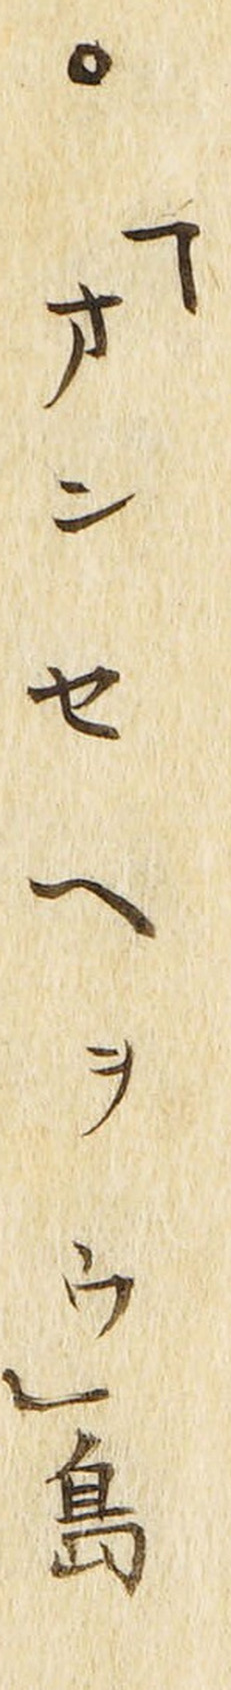◦「オンセヘヲウ」島
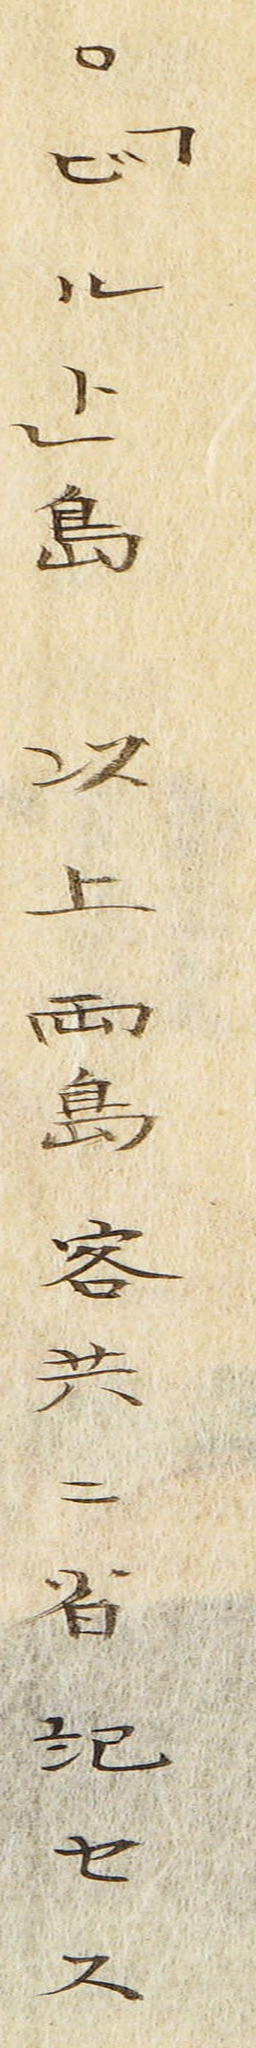◦「ビルト」島以上両島客共ニ省記セス

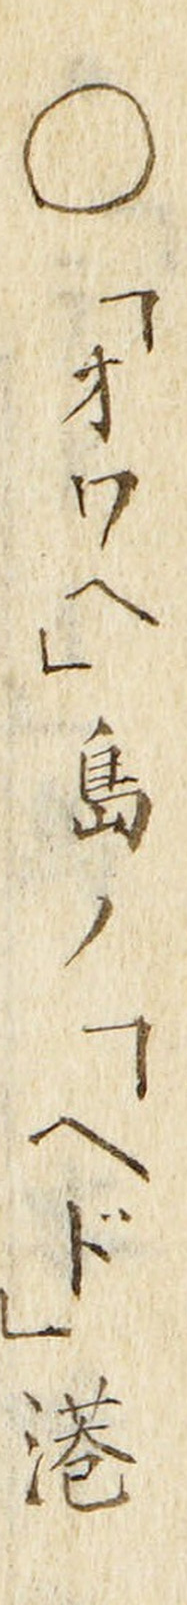○「オワヘ」島ノ「ヘド」港
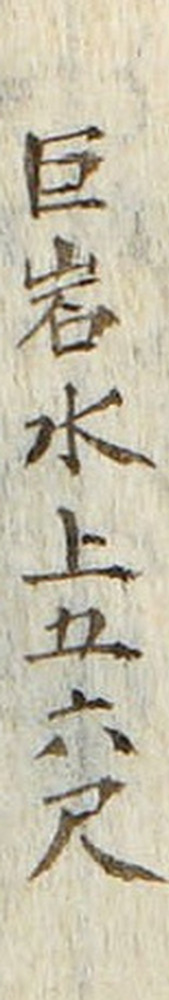巨岩水上五六尺
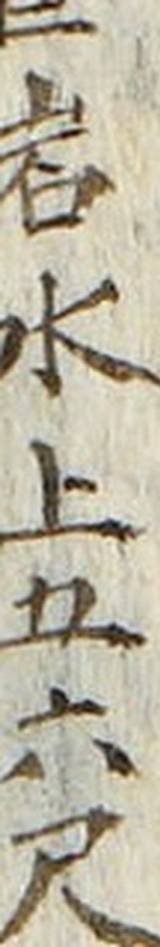巨岩水上五六尺
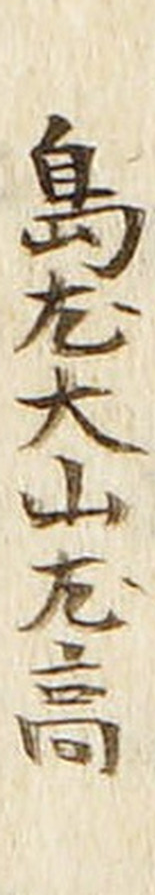島尤大山尤高
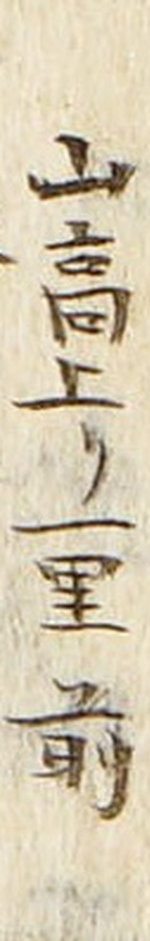山高上リ一里前
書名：流蕃通書
